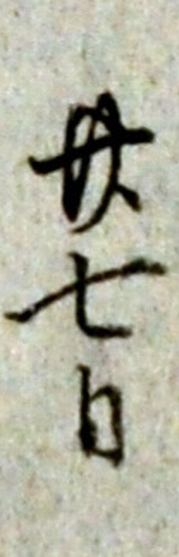廿七日
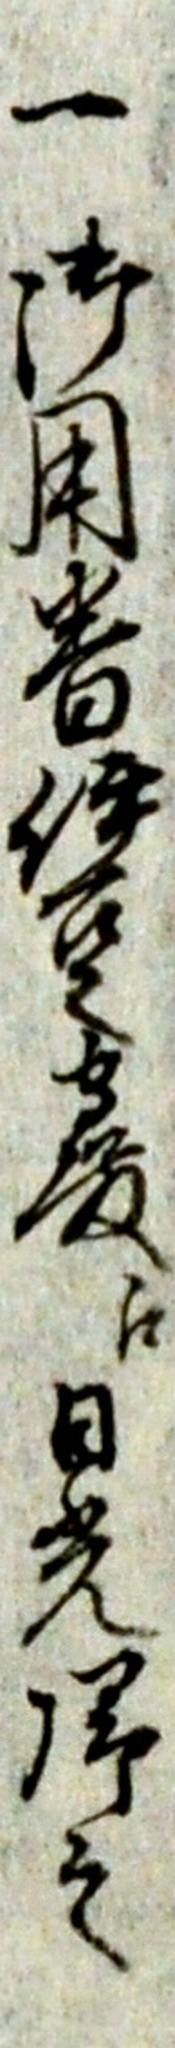一御用番伊豆守殿江日光帰之
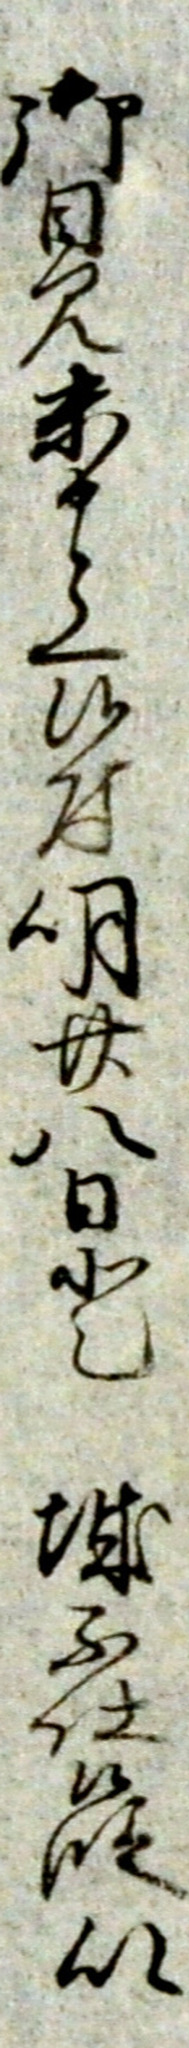御目見未申上候付明廿八日登城不仕候段以
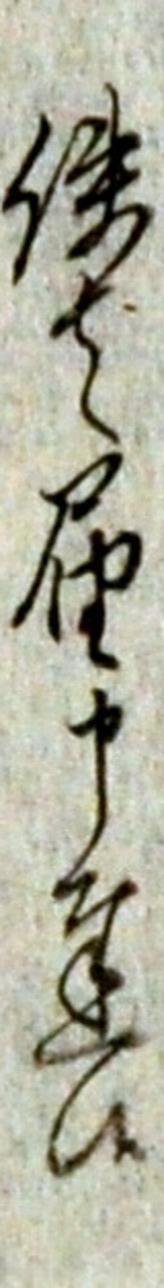使者届申達候
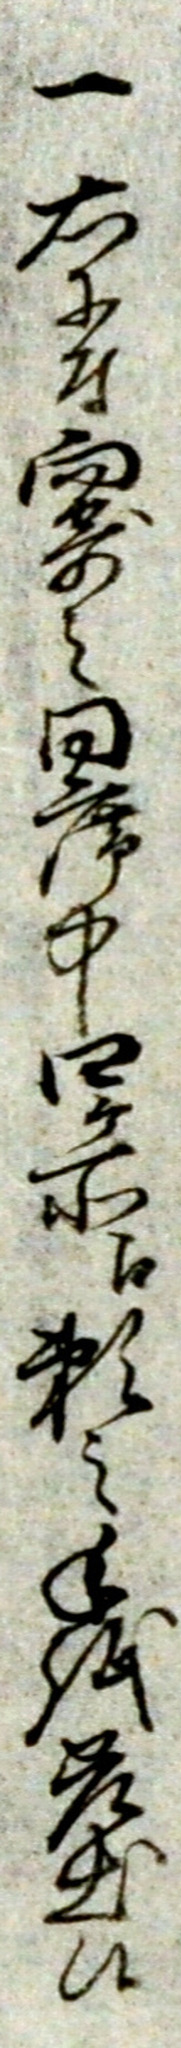一右に付向寄之同席中四ケ所江頼之手紙差出候
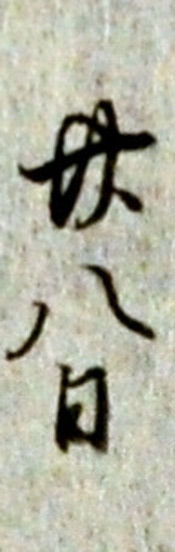廿八日
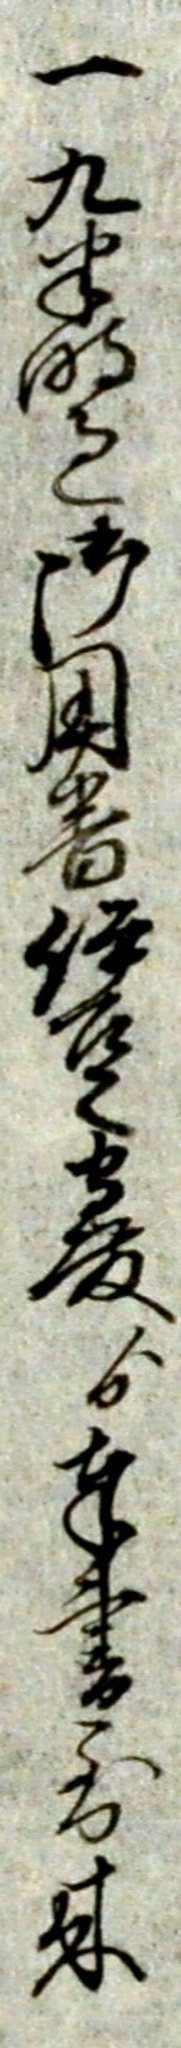一九半時過御用番伊豆守殿ゟ奉書到来
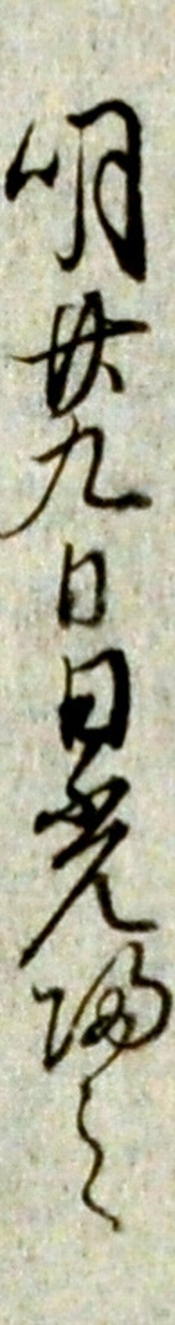明廿九日光帰之
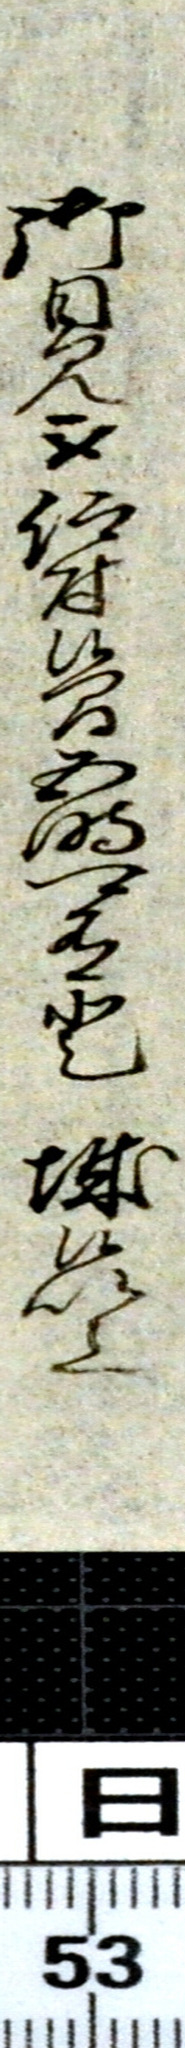御目見被仰付候間五時可有登城候以上
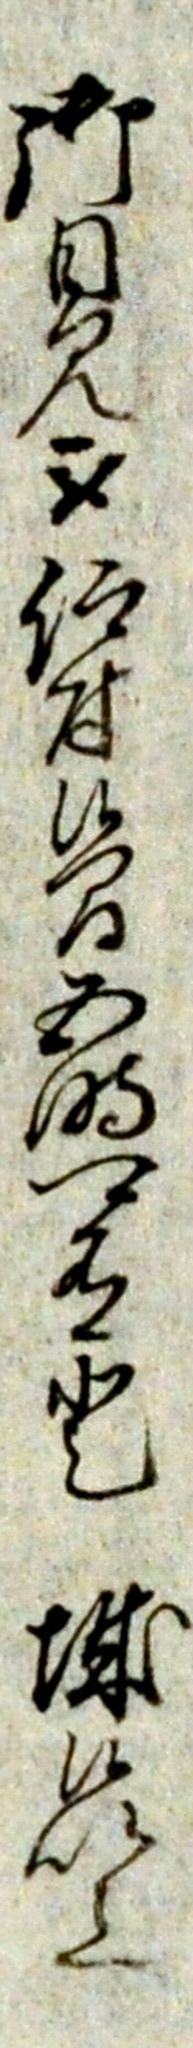御目見被仰付候間五時可有登城候以上
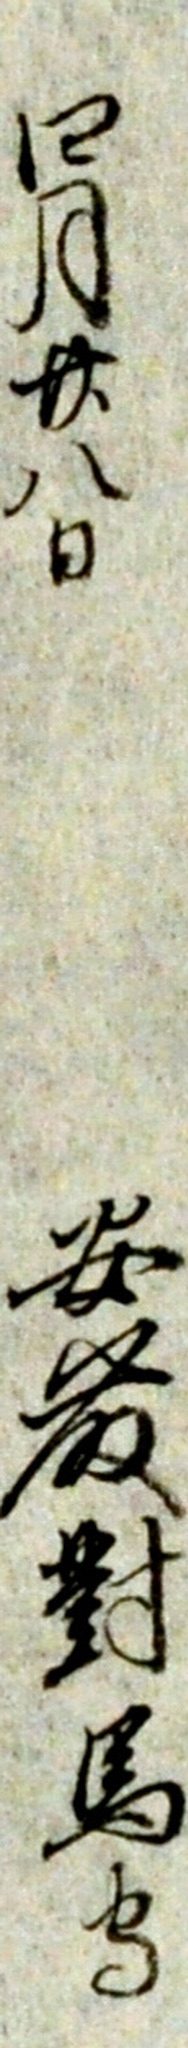四月廿八日安藤対馬守
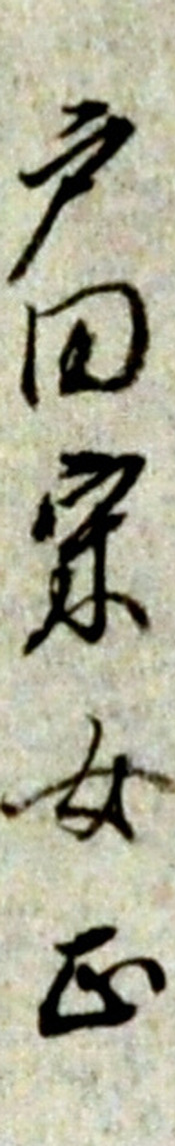戸田采女正
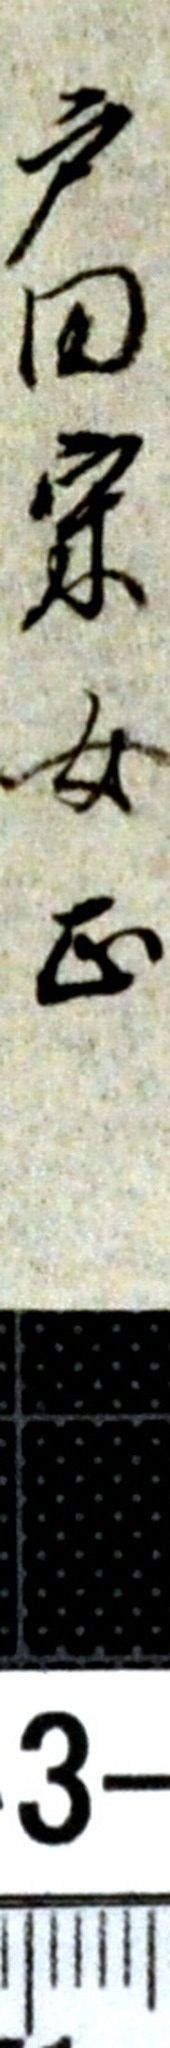戸田采女正
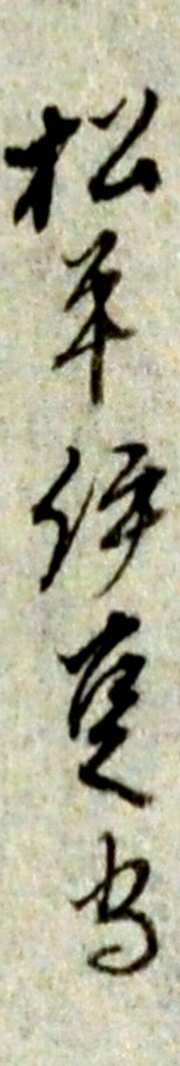松平伊豆守
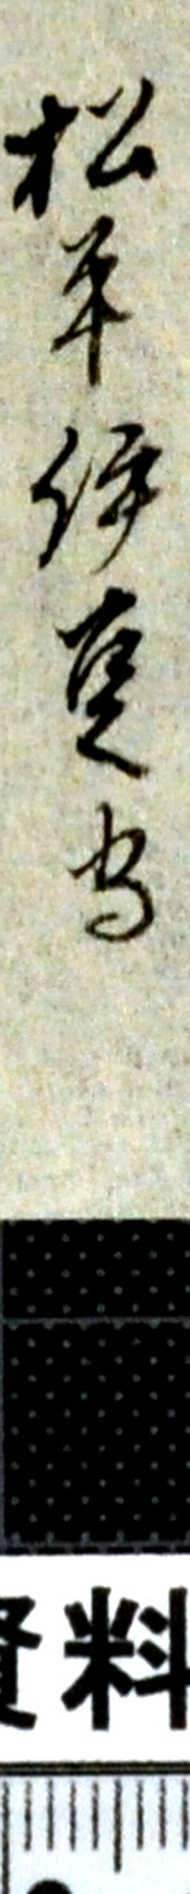松平伊豆守
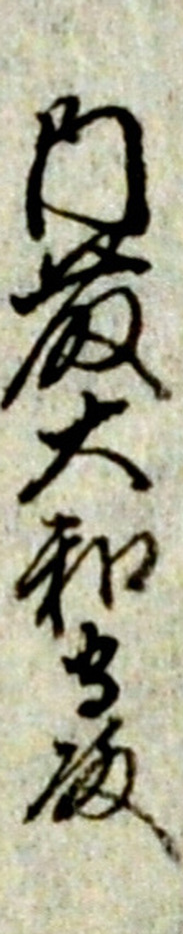内藤大和守殿
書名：日光御名代相勤候節ノ留
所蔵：伊那市立高遠町図書館・合同会社AMANE
